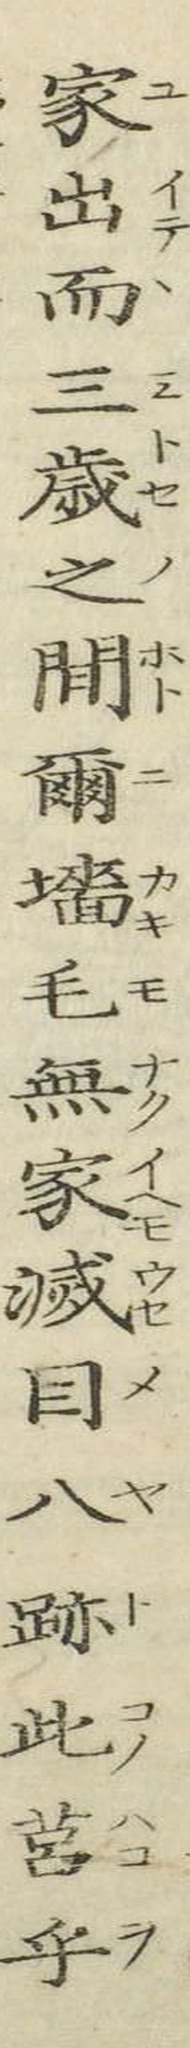家出而三歳之間爾墻毛無家滅目八跡此筥乎
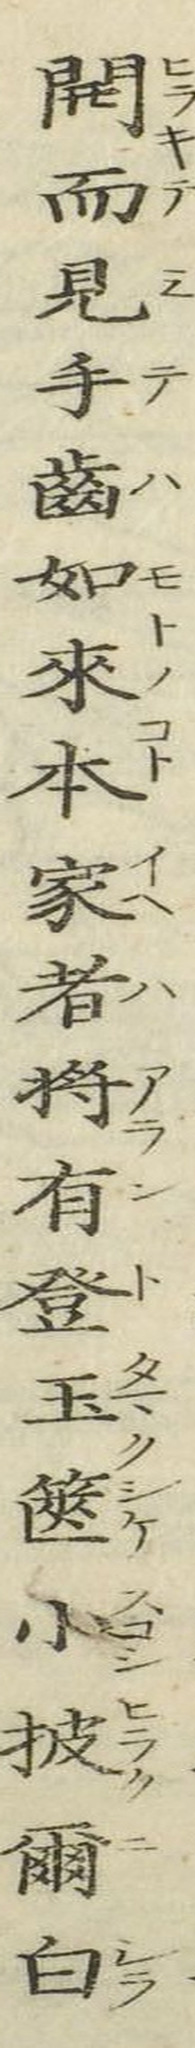開而見手歯如來本家者将有登玉篋小披爾白
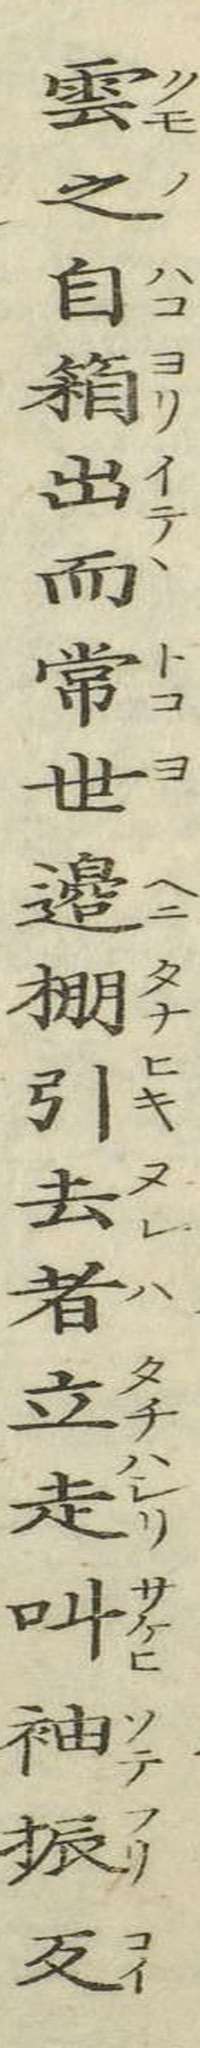雲之自箱出而常世邊棚引去者立走叫袖振
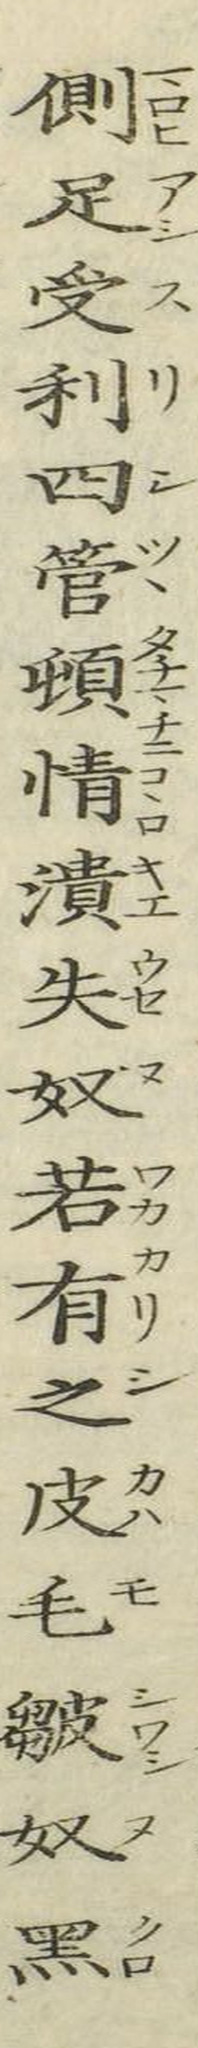側足受利四筒頓情潰失奴若有之皮毛皺奴黒
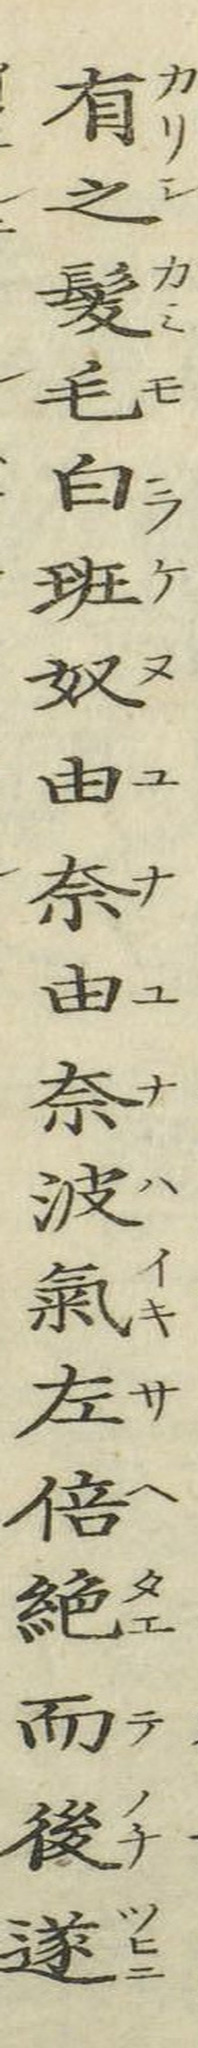有之髪毛白斑奴由奈由奈波氣左倍絶而後遂
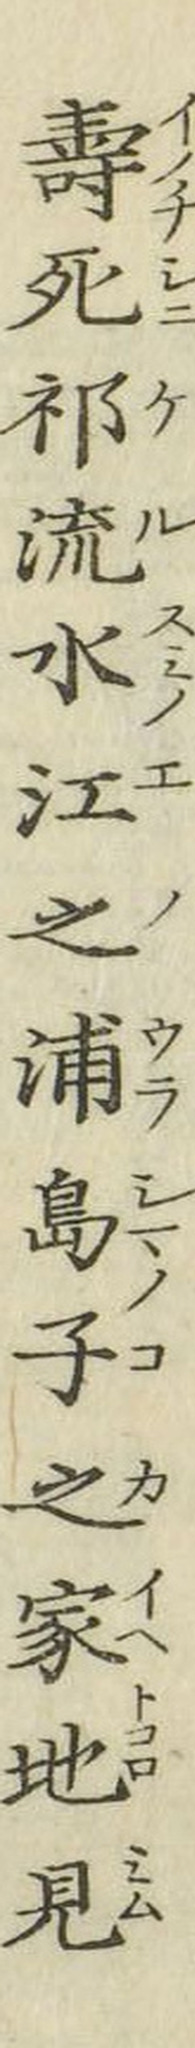壽死祁流水江之浦島子之家地見
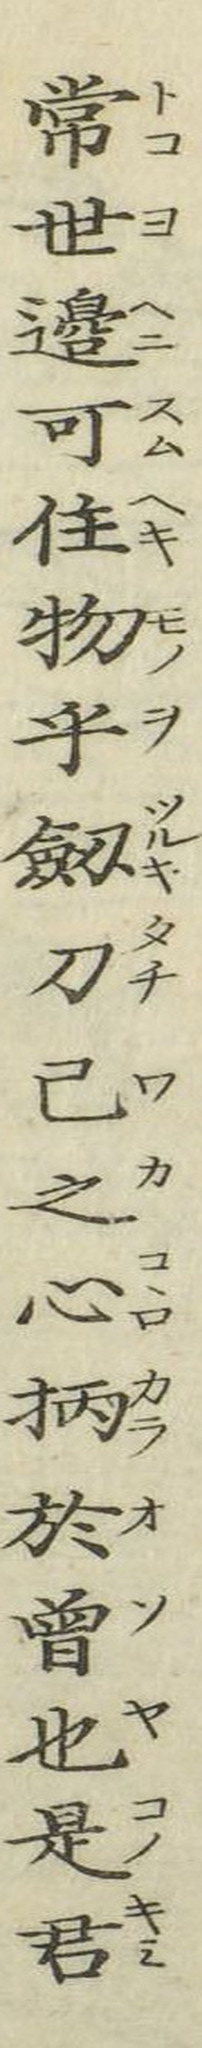常世邊可住物乎劔刀己之心抦於曽也是君

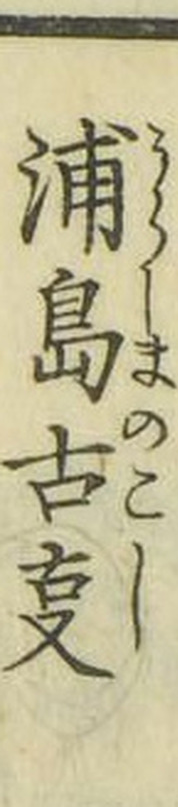浦島古事

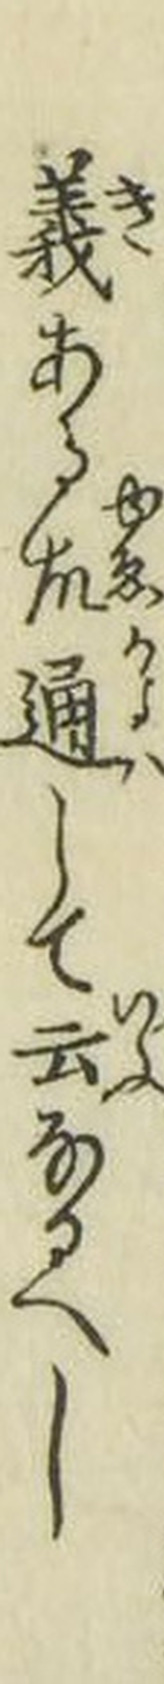義ある故通して云なるへし
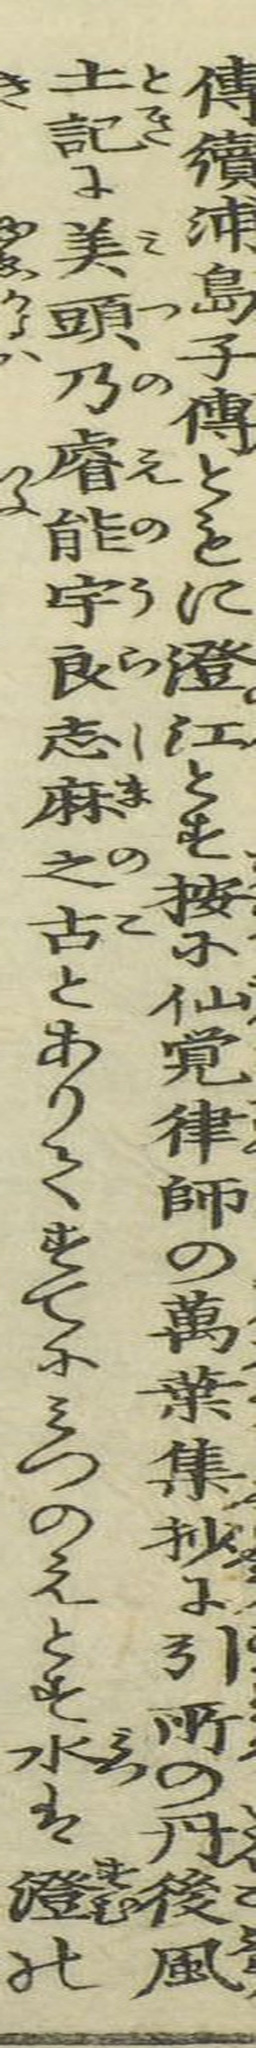土記に美頭乃睿能宇良志麻之古とありてすてにみつのえとす水は澄の
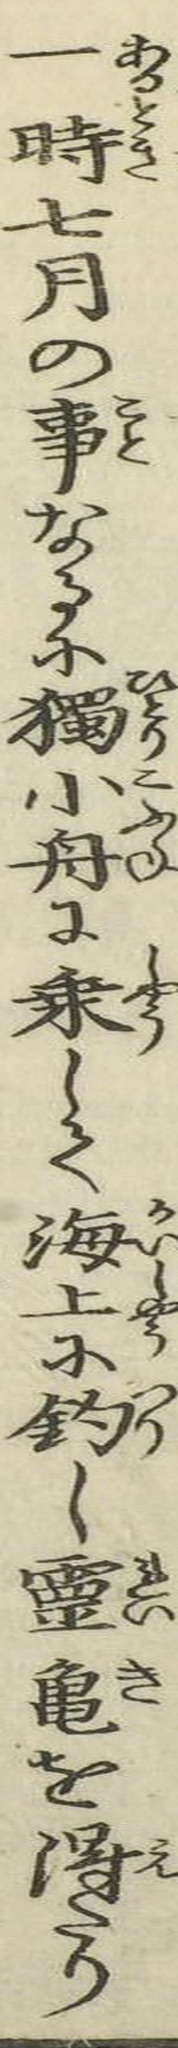一時七月の事なるに獨小舟に乗して海上に釣し霊亀を得たり
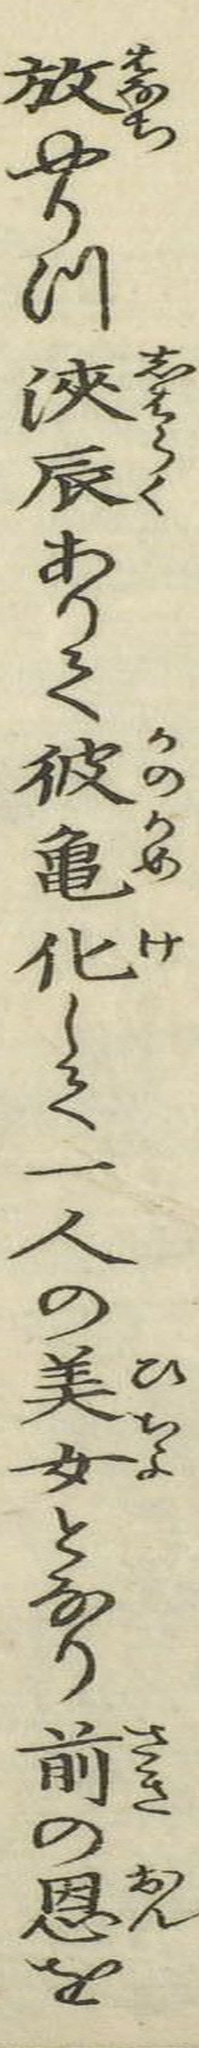放やりつ浹辰ありて彼亀化して一人の美女となり前の恩を
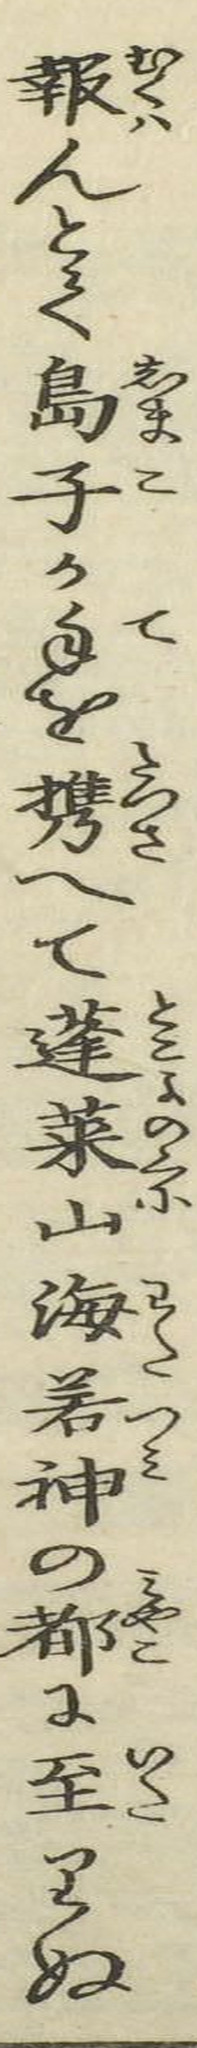報んとて島子か手を携へて蓬莱山海若神の都に至りぬ
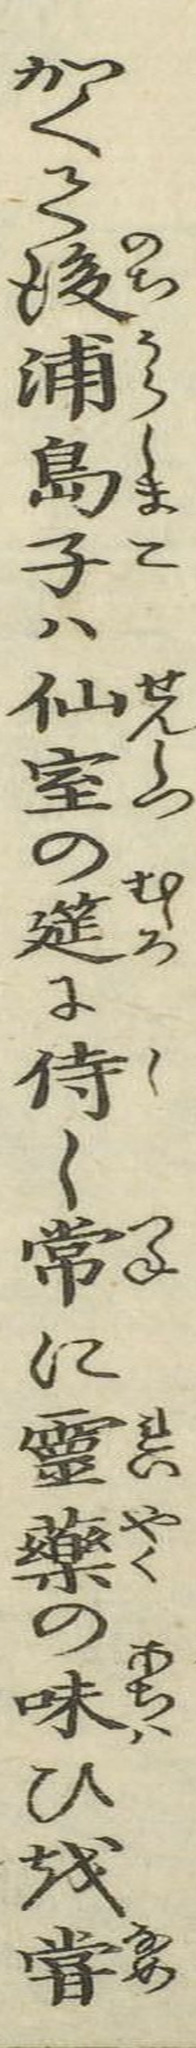かくて後浦島子は仙室の筵に侍し常に霊薬の味ひを嘗
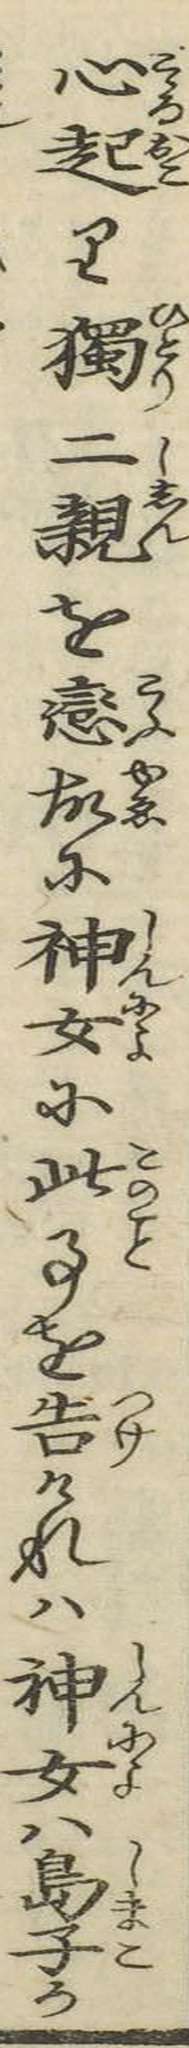心起り獨二親を戀故に神女に此事を告けれは神女は島子か
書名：江戸名所図会 20巻 巻之5
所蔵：東京学芸大学教育コンテンツアーカイブ
